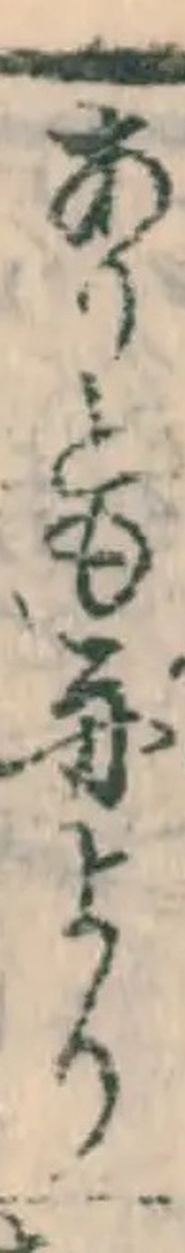ありとも舟より
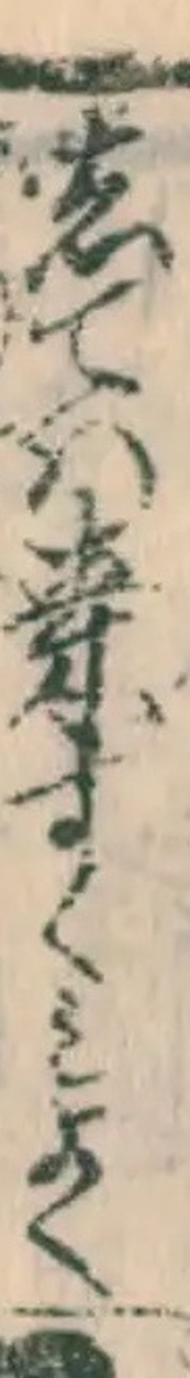しては桑すゝみよく
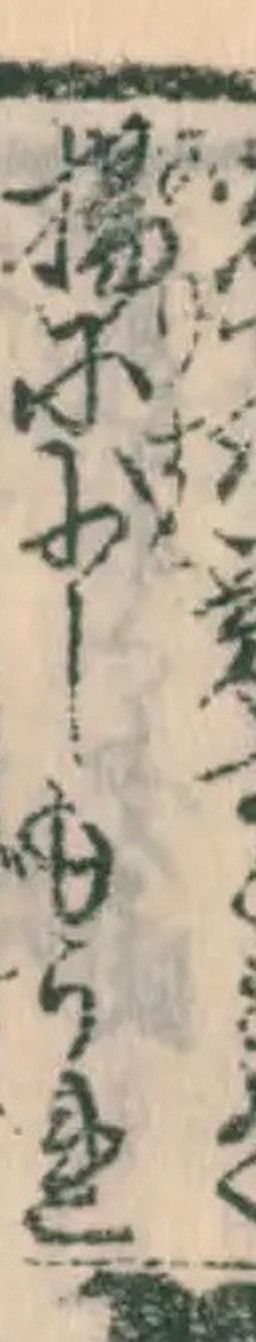揚に少しもうれ
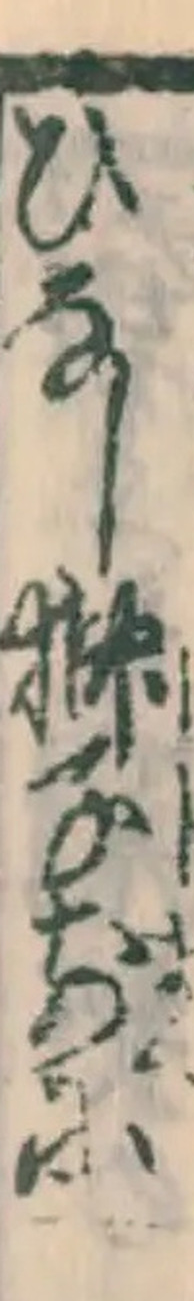ひなし獅子前に
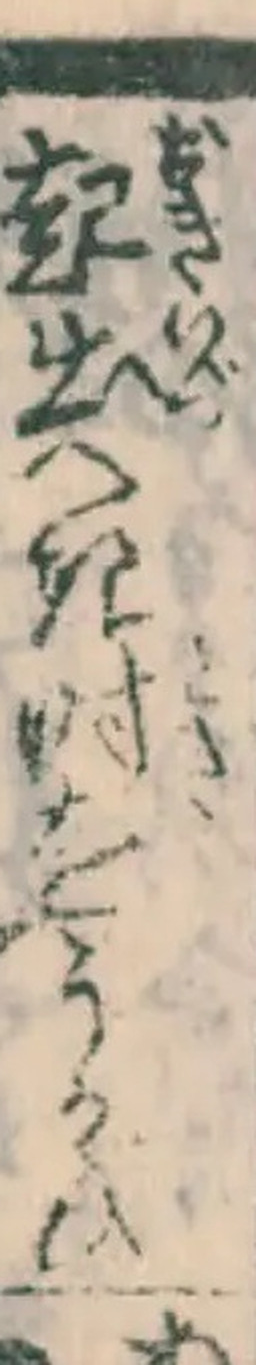起出べき時をうかゞひ
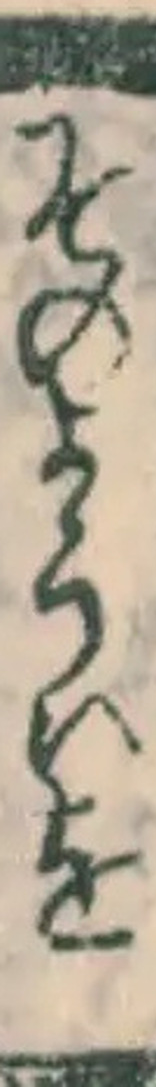そのよういを
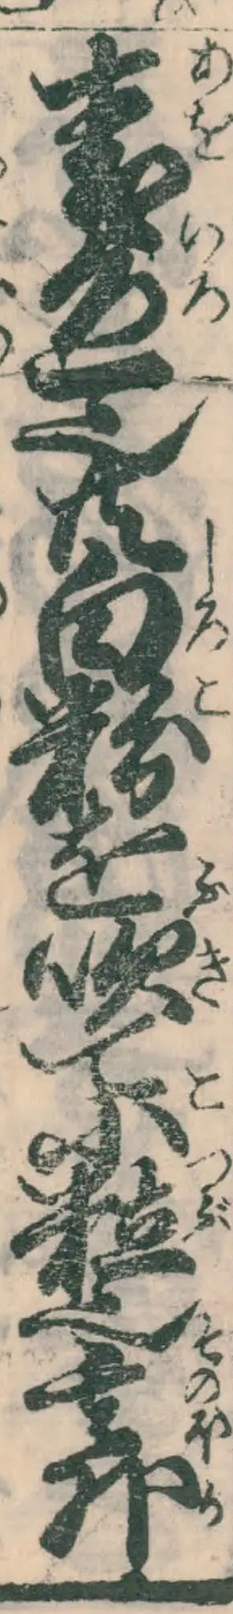青色也とも白粉を吹て小粒也其外
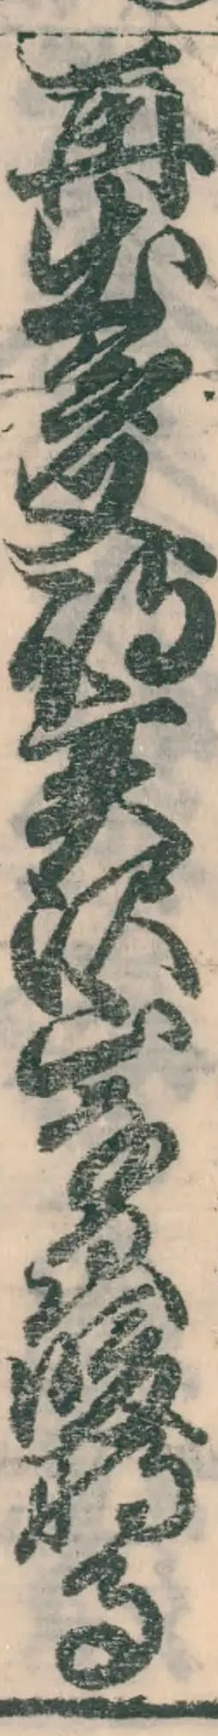再出多又跡実沢山なるは暖なる
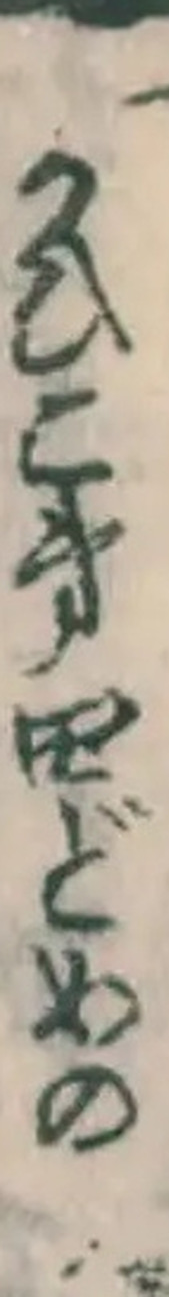〽かひこ第四どめの
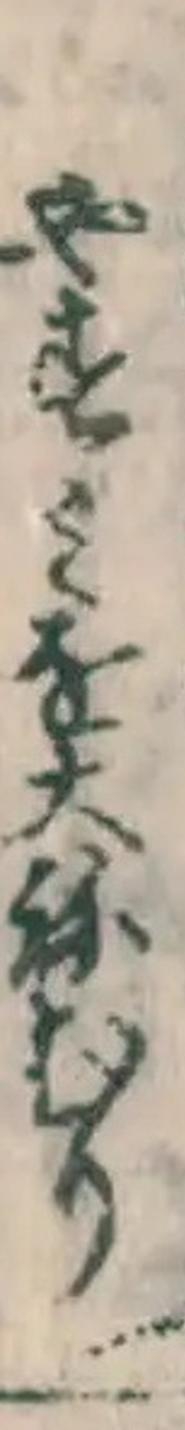やすみを大ねむり
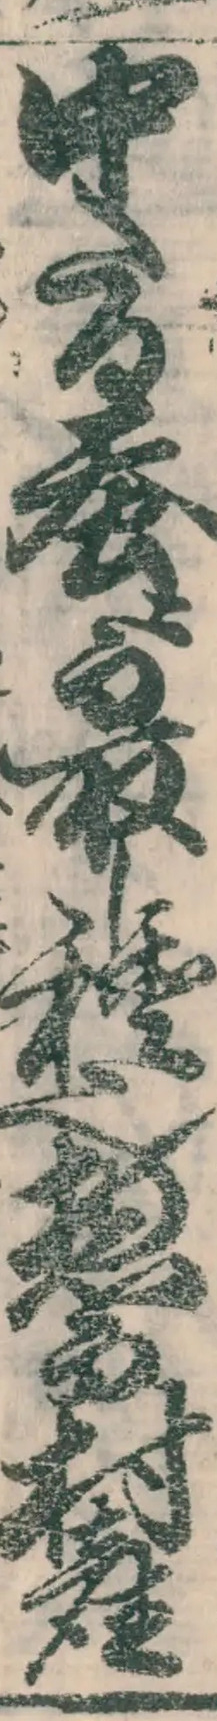中たる蚕にて取し種也惣而村産
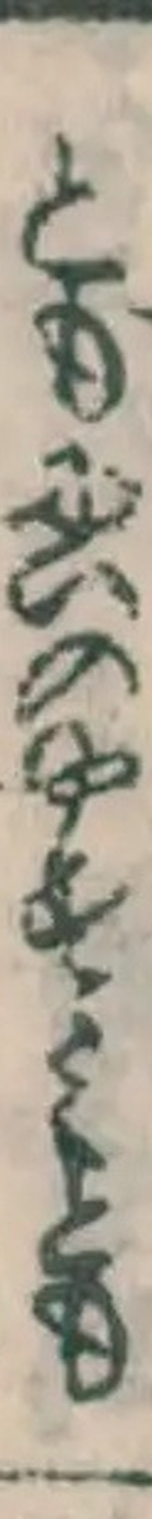ともにはのやすみとも
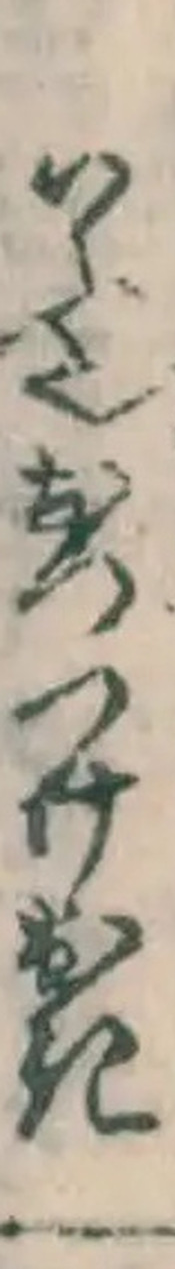いふ也おつつけおき
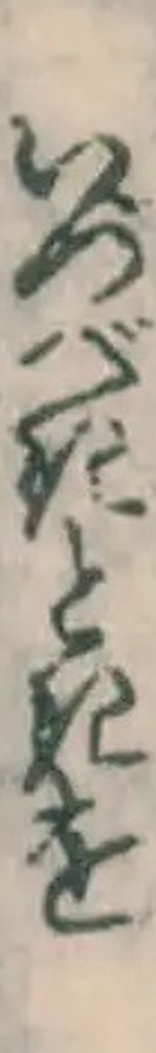いつべきときを
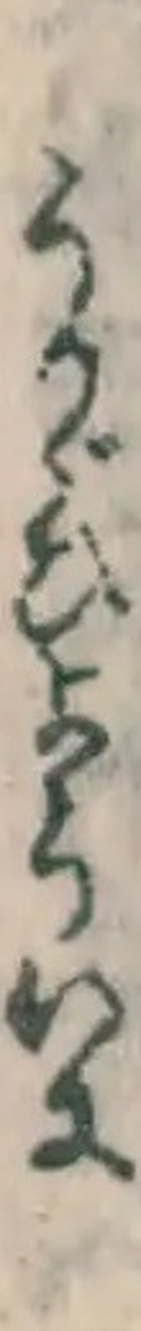うかゞひよういに
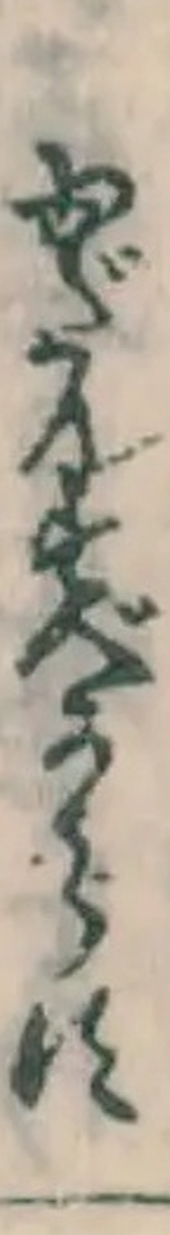ゆだんすべからす
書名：養蚕往来
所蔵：国立国会図書館 National Diet Library, JAPAN
